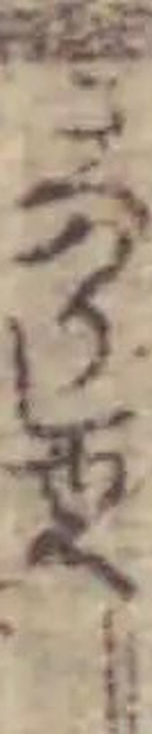さへつりしゆへ
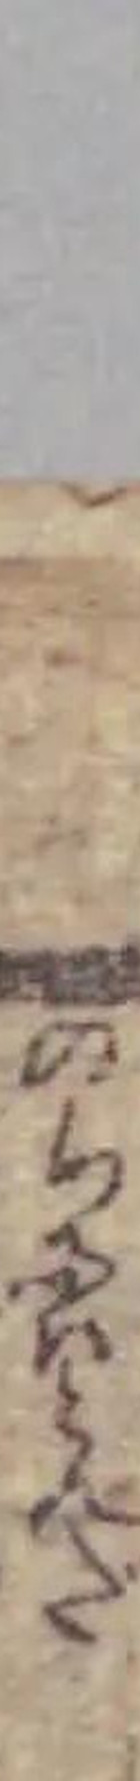のちにはとんだ
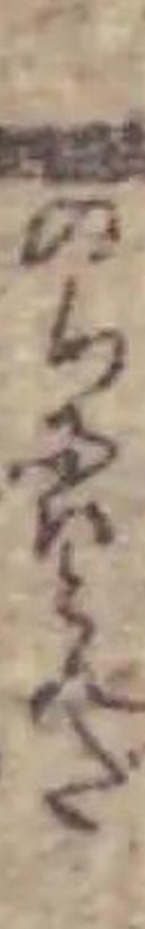のちにはとんだ
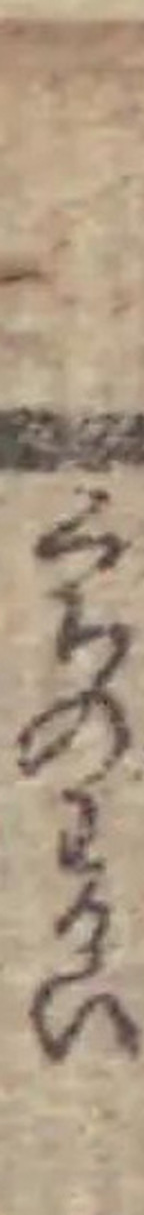くちのわかい
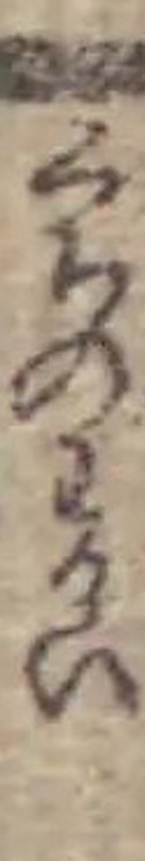くちのわかい
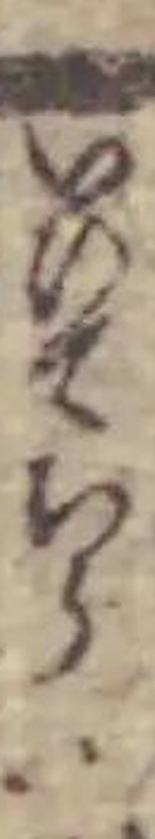いいてちう
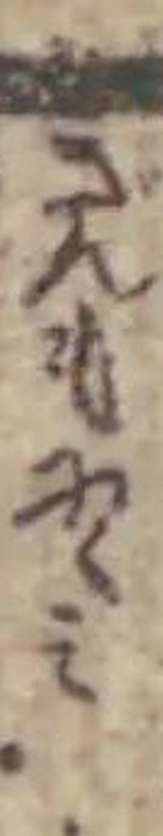ざんもにくみ
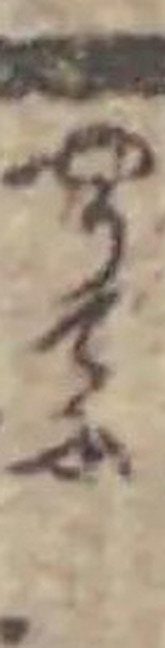やりてに
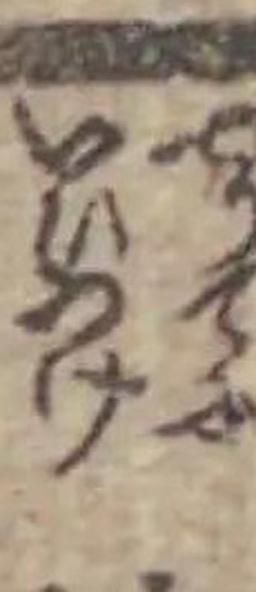いひつけ
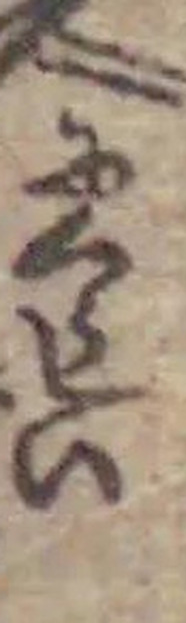にくらしい
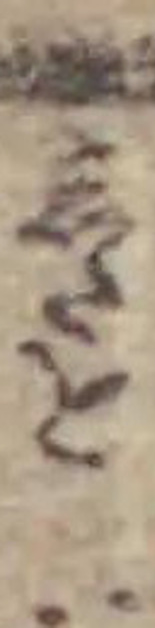したを
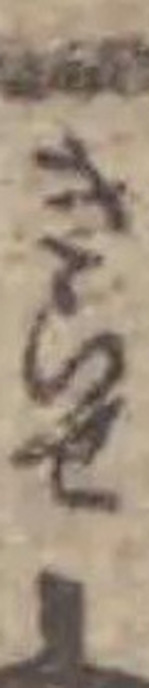きらせ
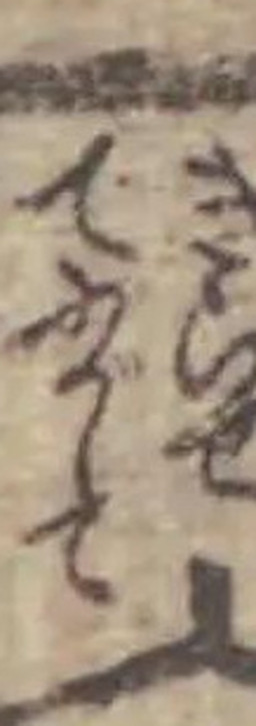てにがして
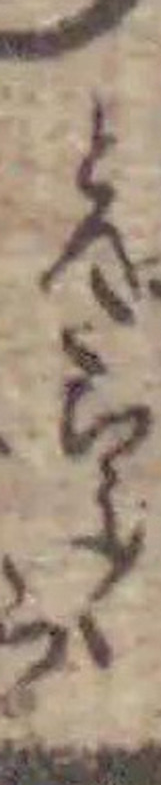とんだちら〳〵
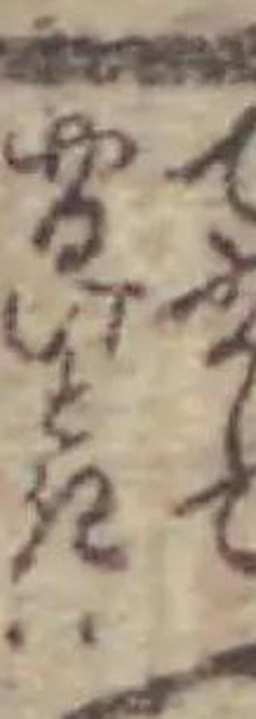やる此とき
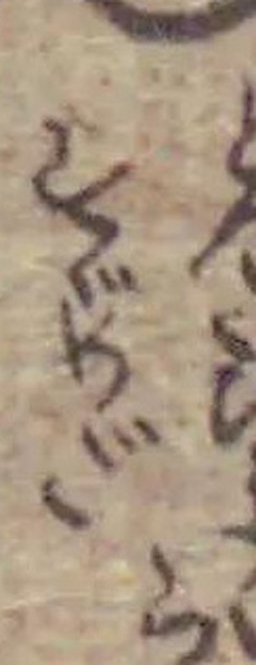すゞめだ
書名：冷水灰毛猫 2巻
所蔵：国立国会図書館 National Diet Library, JAPAN
